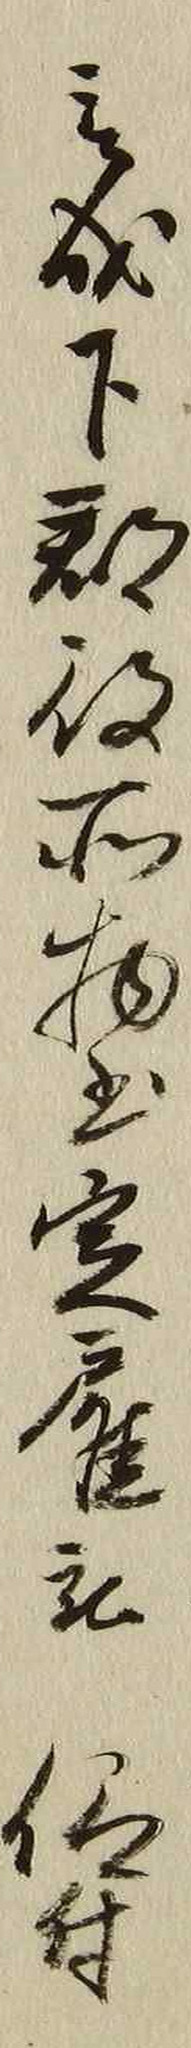被成下郡役所物書定雇被仰付
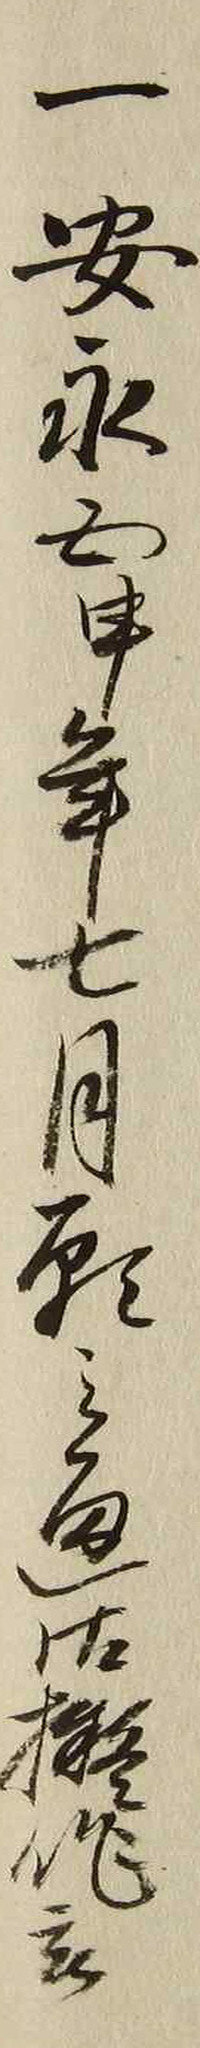一安永五申年七月願之通御擬作被
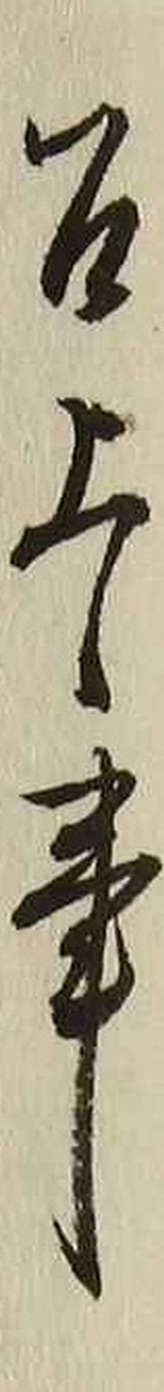召上候事
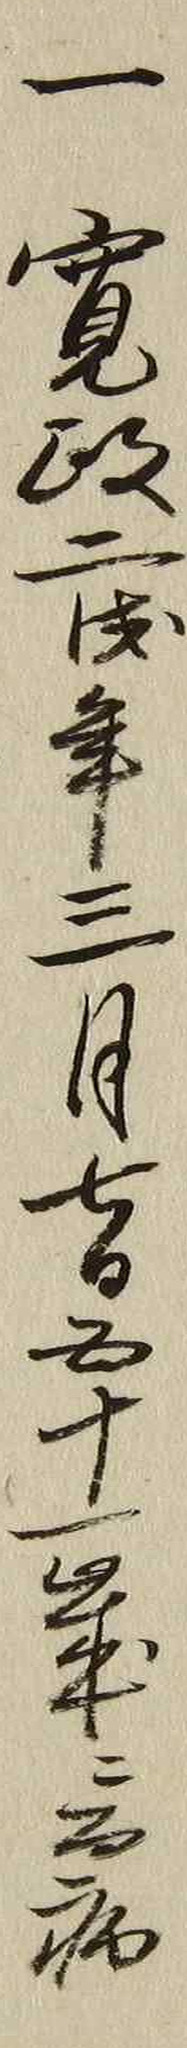一寛政二戌年三月七日五十一歳ニ而病
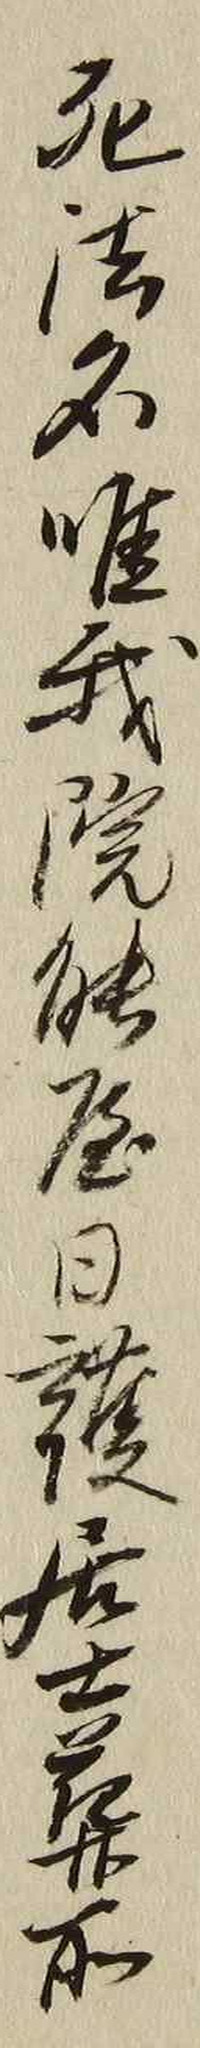死法名唯我院能屋日護居士葬所
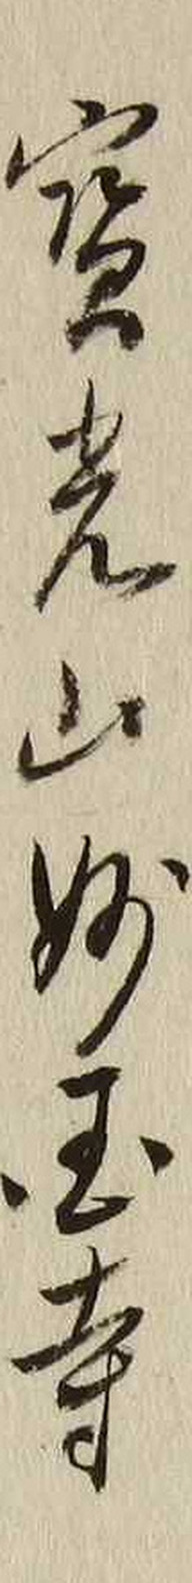宝光山妙国寺
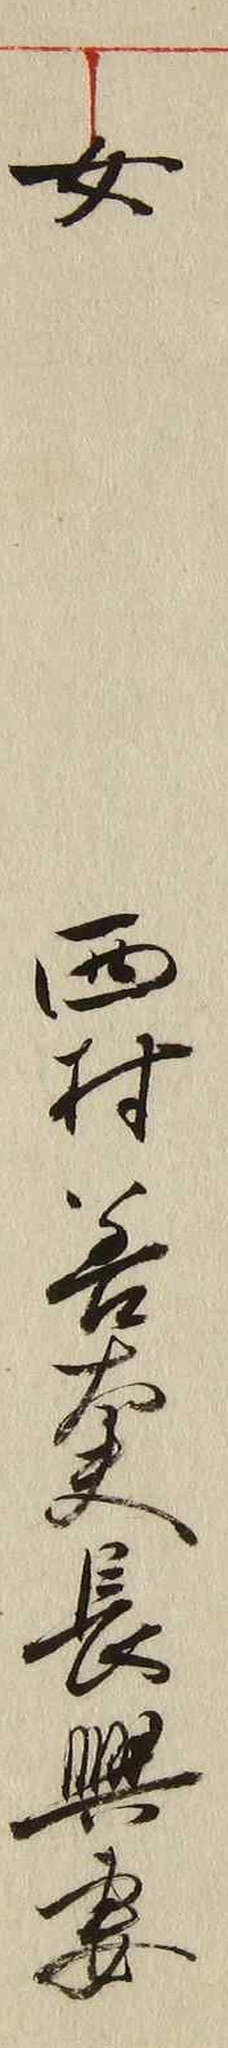女西村善太夫長興妻
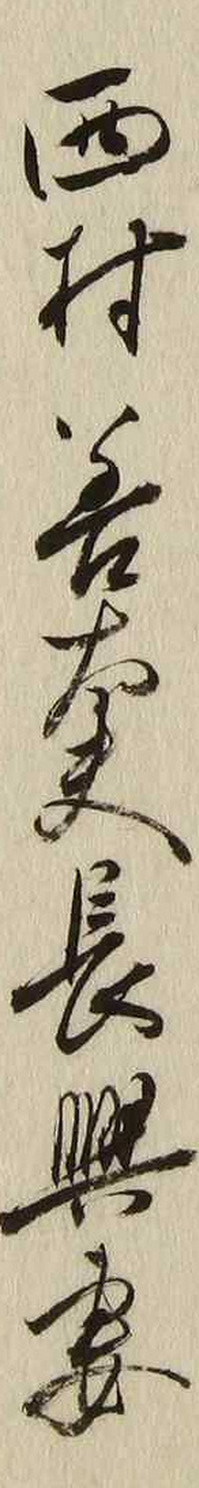女西村善太夫長興妻
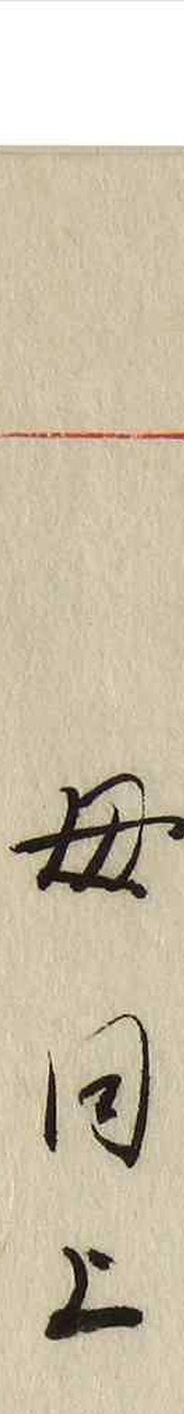母同上
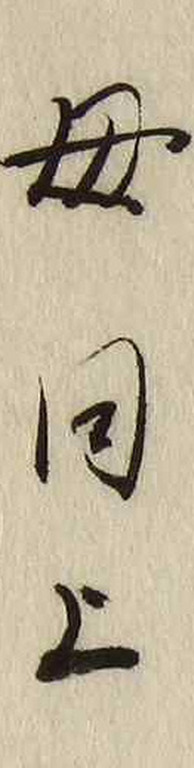母同上
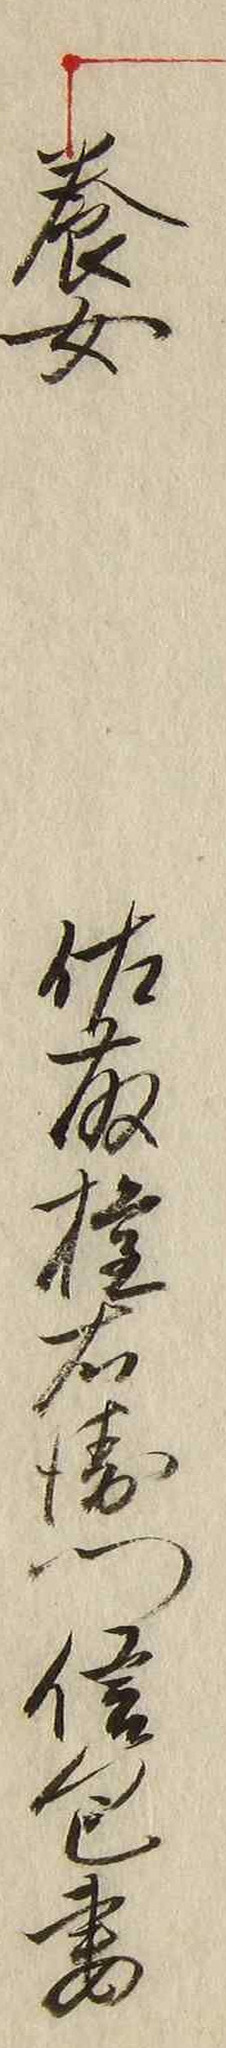養女佐藤権右衛門信包妻

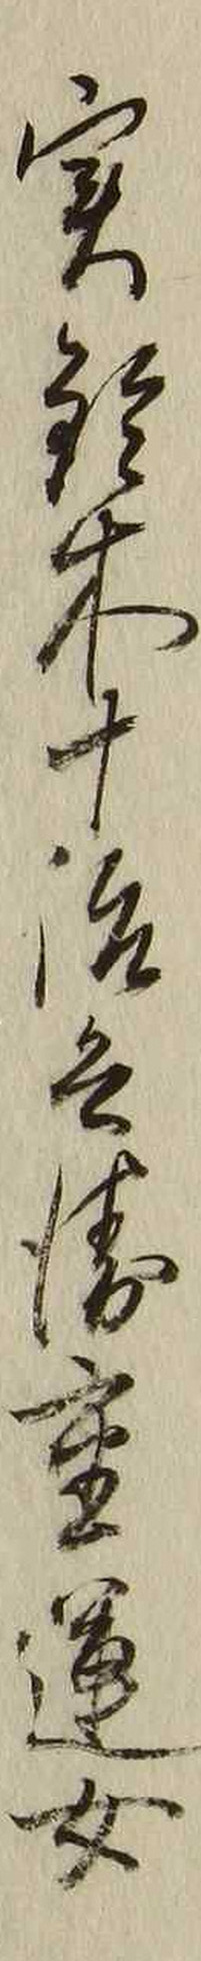実鈴木十治兵衛重運女
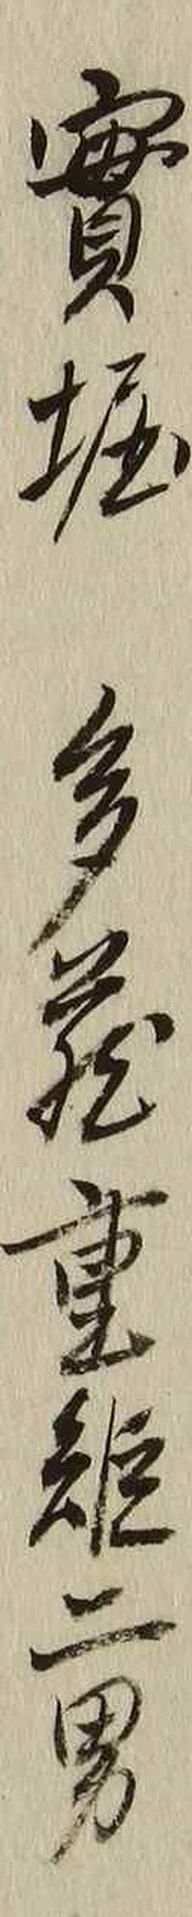実堀多蔵重矩二男
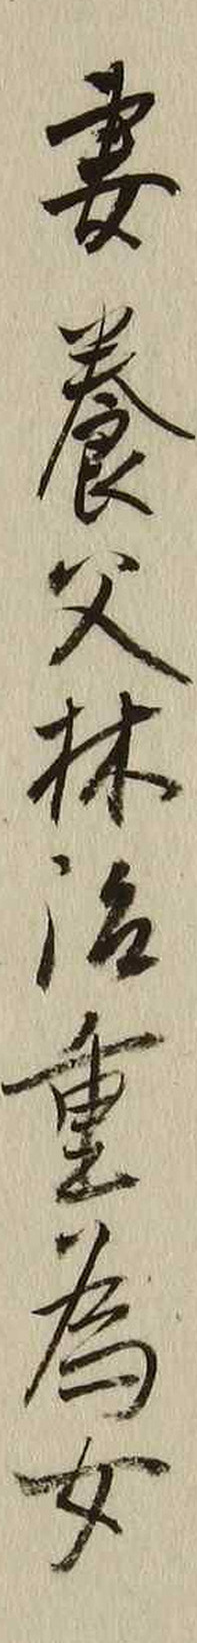妻養父林治重為女
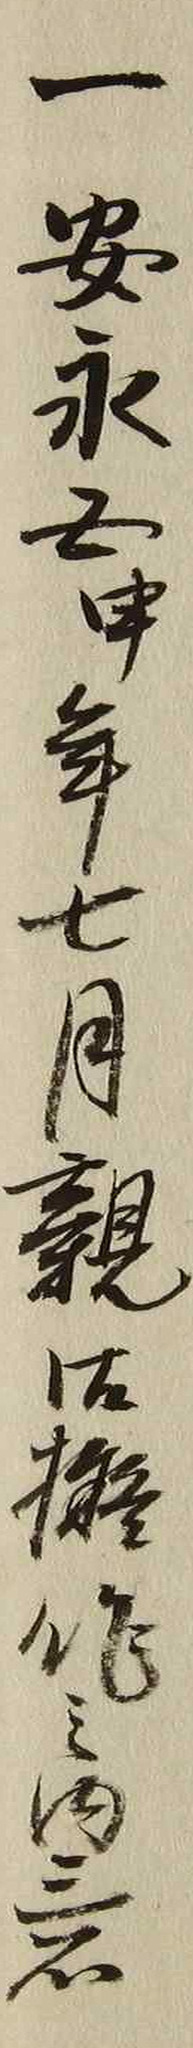一安永五申年七月親御擬作之内三石
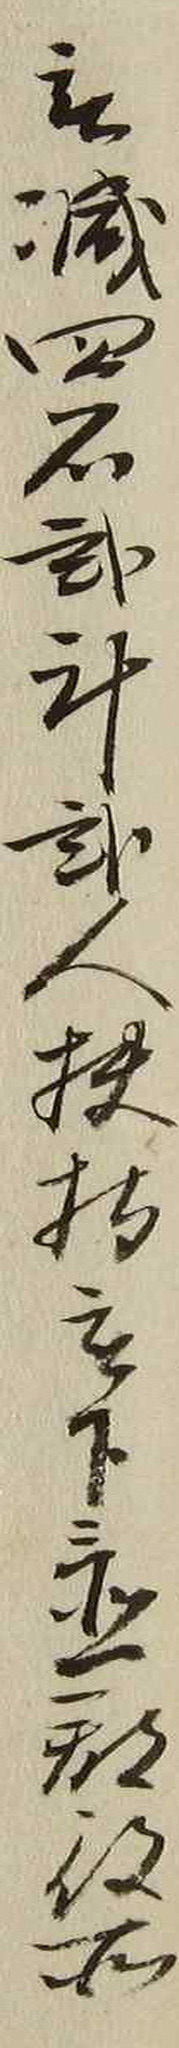被減四石弐斗弐人扶持被下置郡役所
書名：諸士系譜　巻之352　す之部2
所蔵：会津若松市立会津図書館
